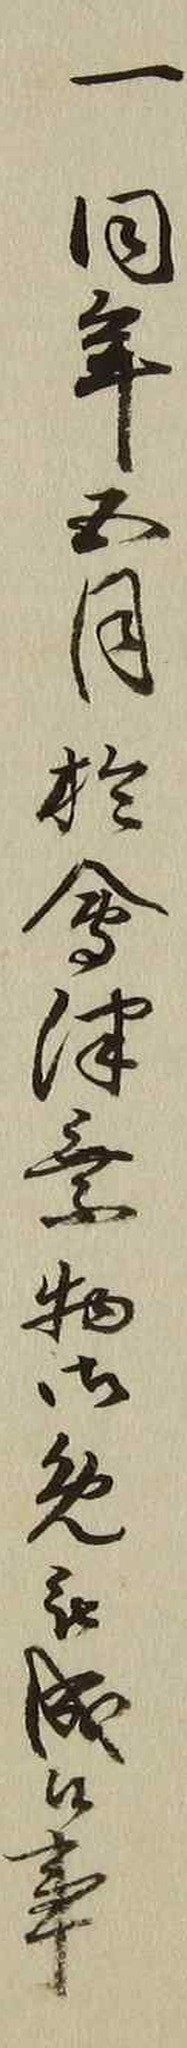一同年五月於会津乗物御免被成候事
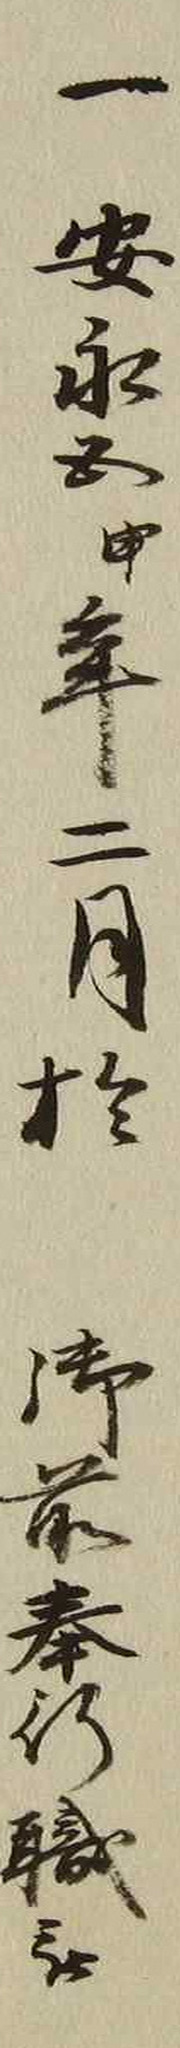一安永五申年二月於御前奉行職被
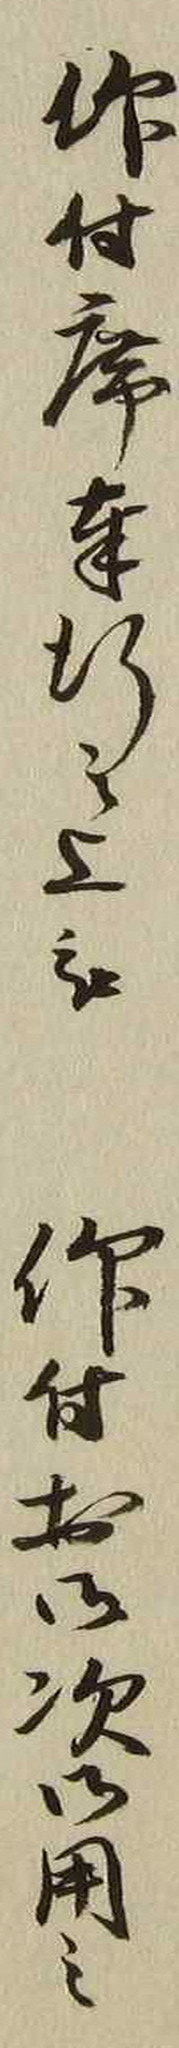仰付席奉行之上被仰付於御次御用之
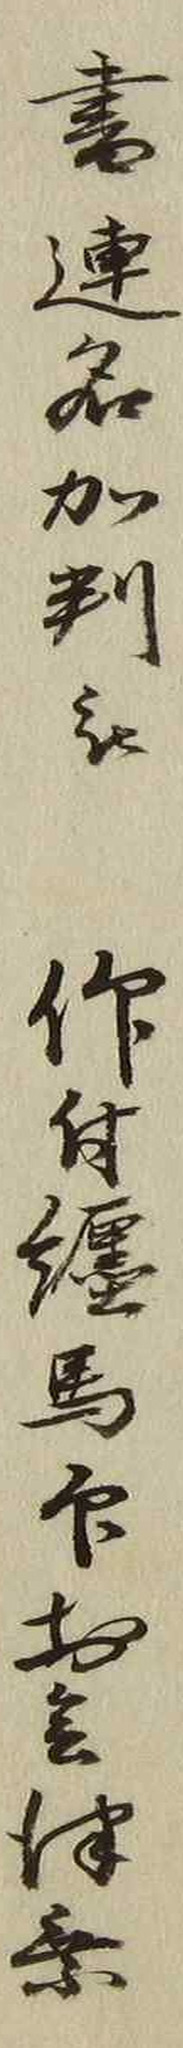書連名加判被仰付纏馬印於会津乗
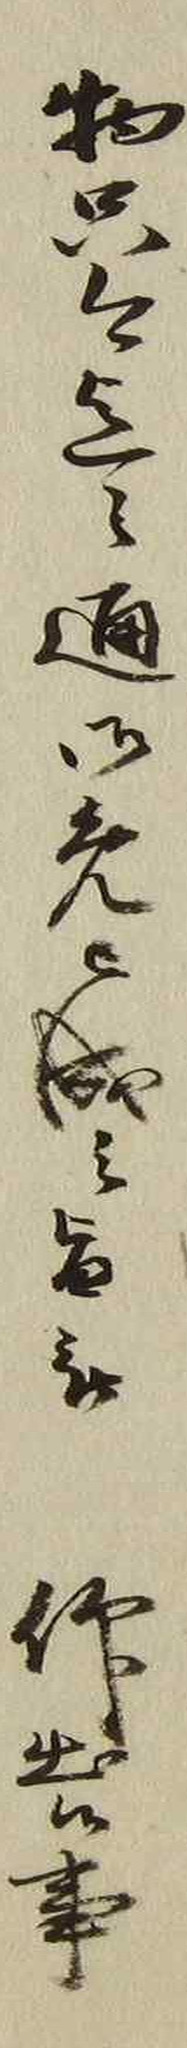物只今迄之通御免被成候旨被仰出候事
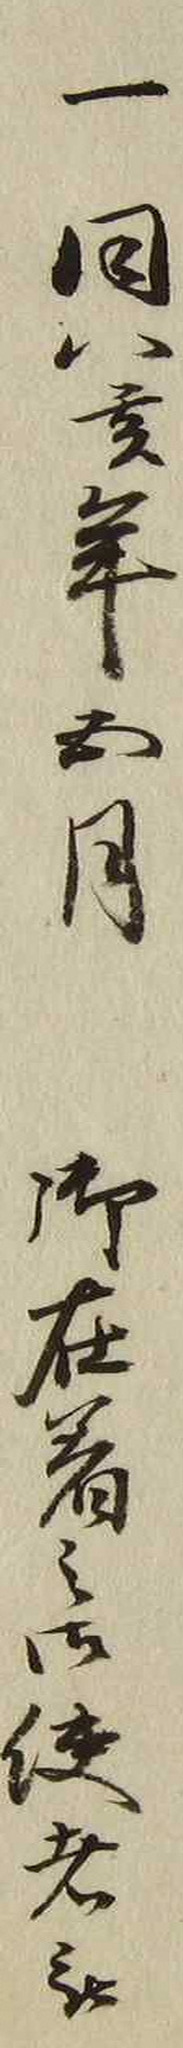一同八亥年五月御在着之御使者被
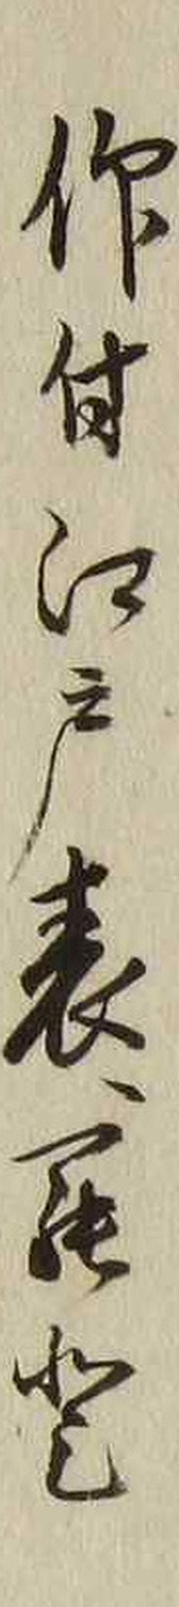仰付江戸表へ罷登
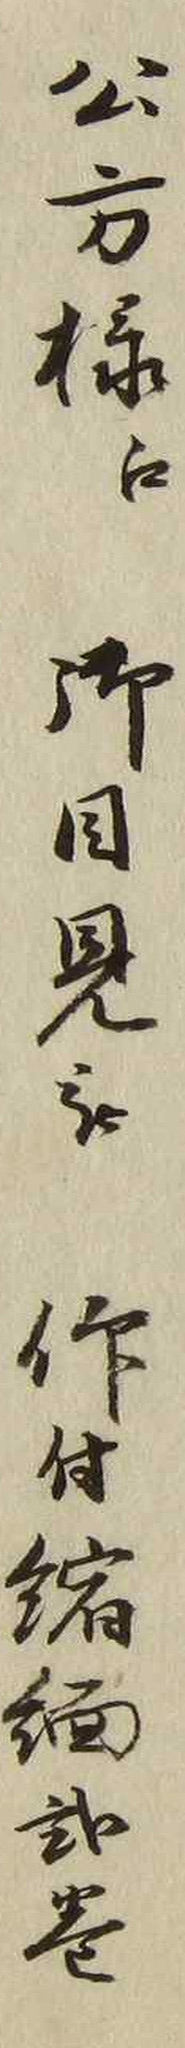公方様江御目見被仰付縮緬弐巻
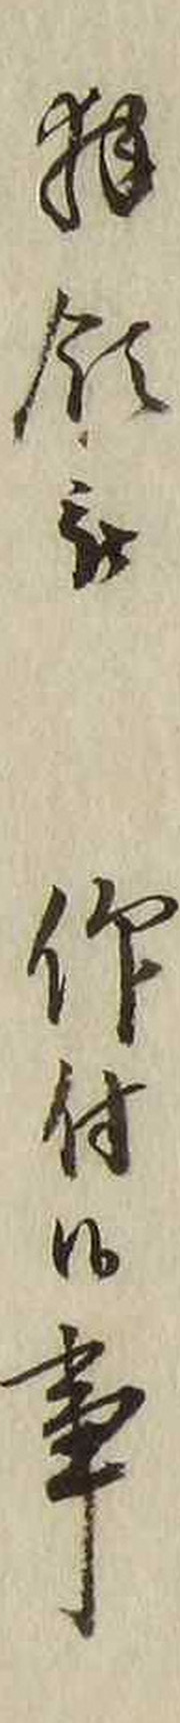拝領被仰付候事
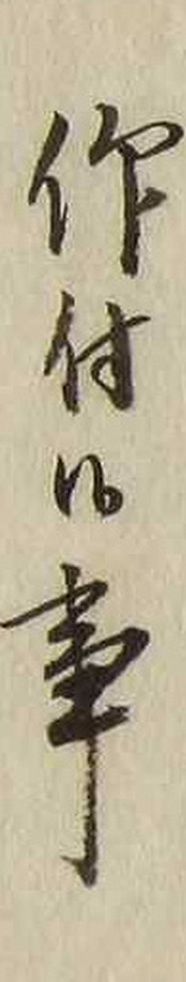仰付候事
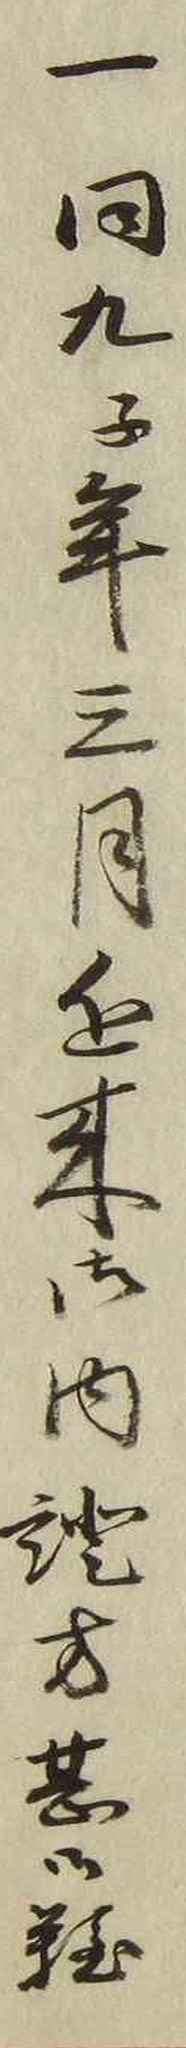一同九子年三月近来御内証方甚御難

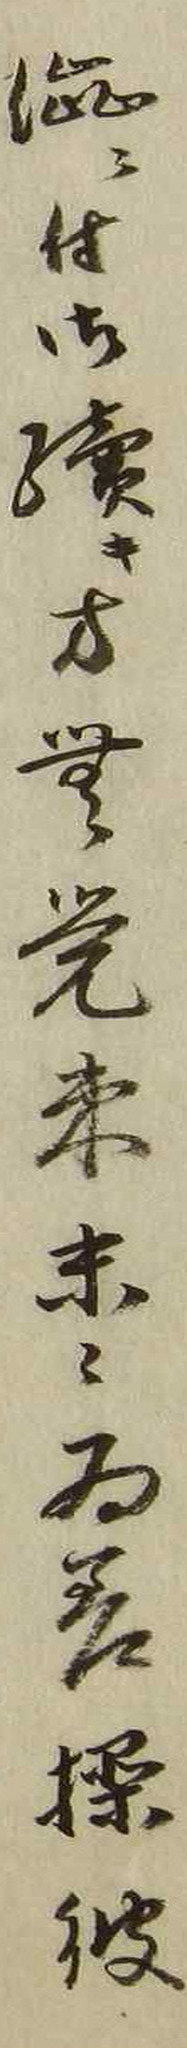渋に付御続き方無覚束末々為差繰彼
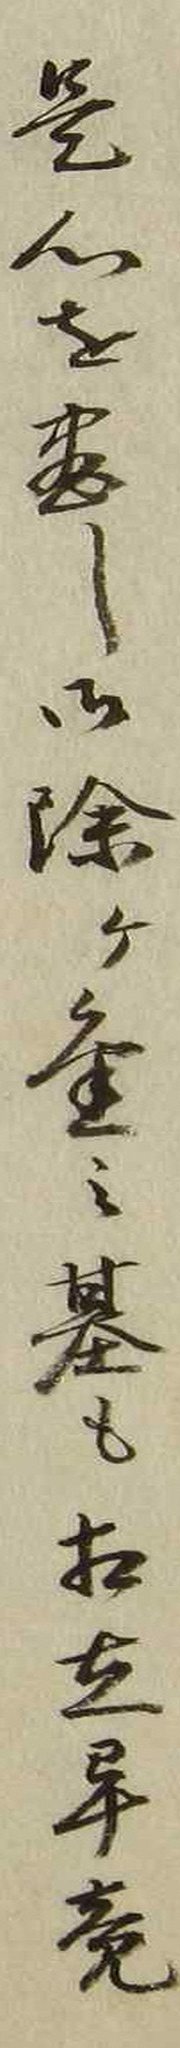是心を尽し御除け金之基も相立畢竟
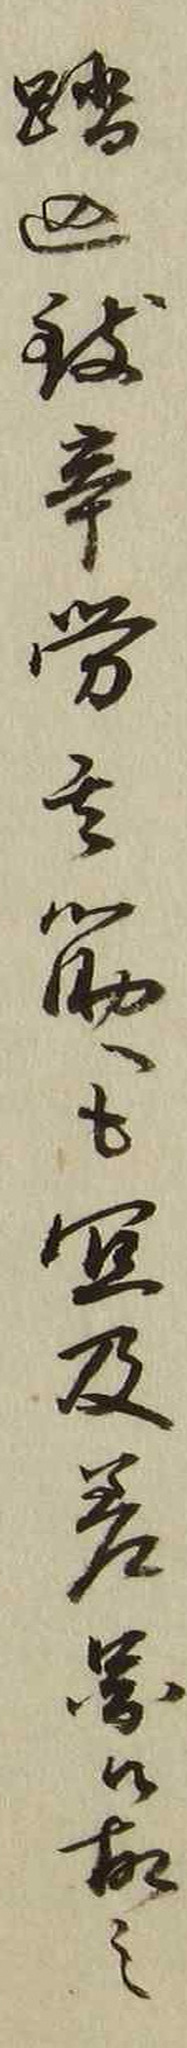踏込致辛労其筋へも宜及差図候故之
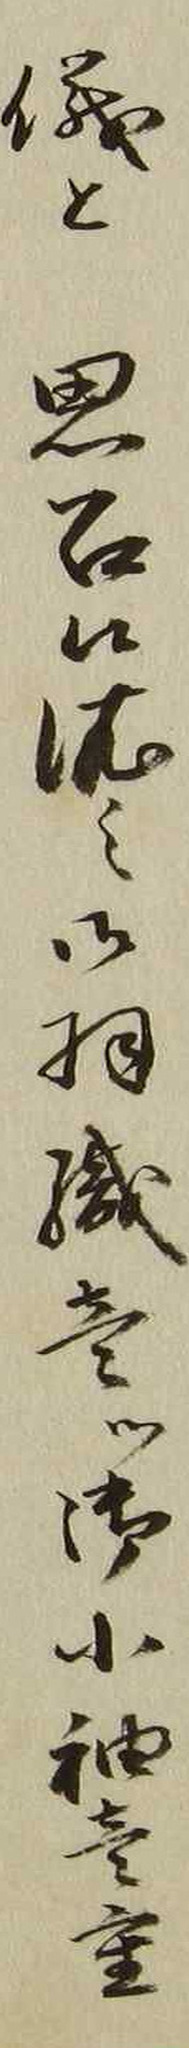儀と思召候依之御羽織壱つ御小袖壱重
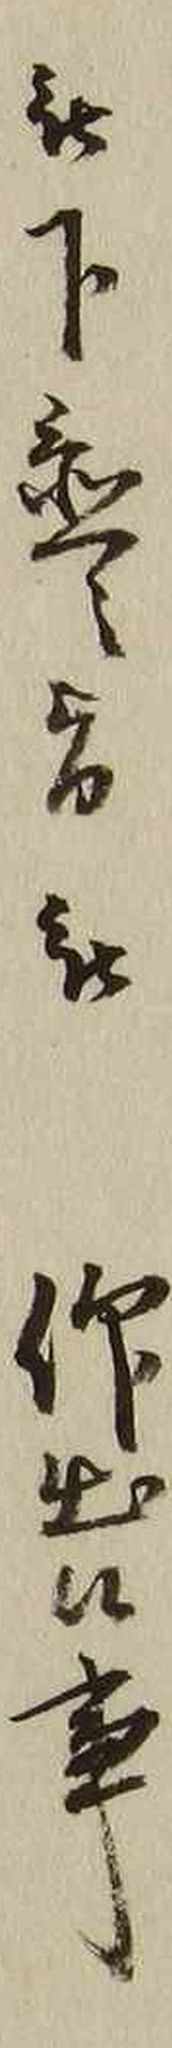被下置候旨被仰出候事
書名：諸士系譜　巻之125　た之部1
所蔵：会津若松市立会津図書館
